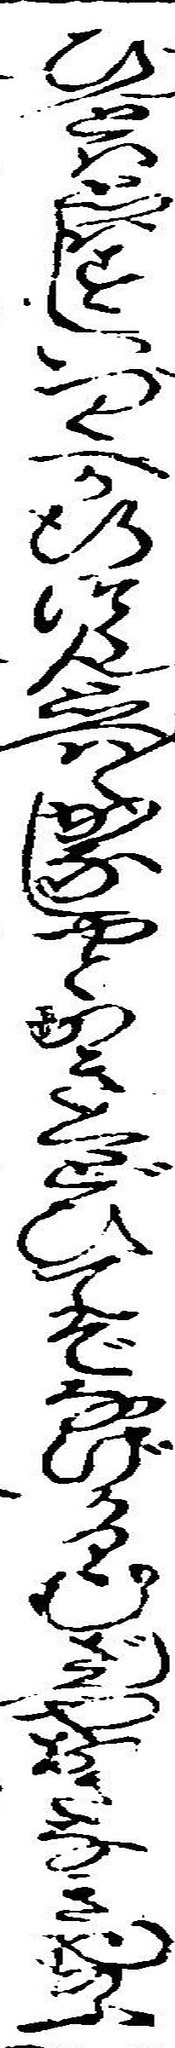びんとは思はすしいづくへか行つらん思へは〳〵かなしやとかきくどひてぞなげかるゝむざんやおさなき物のふ
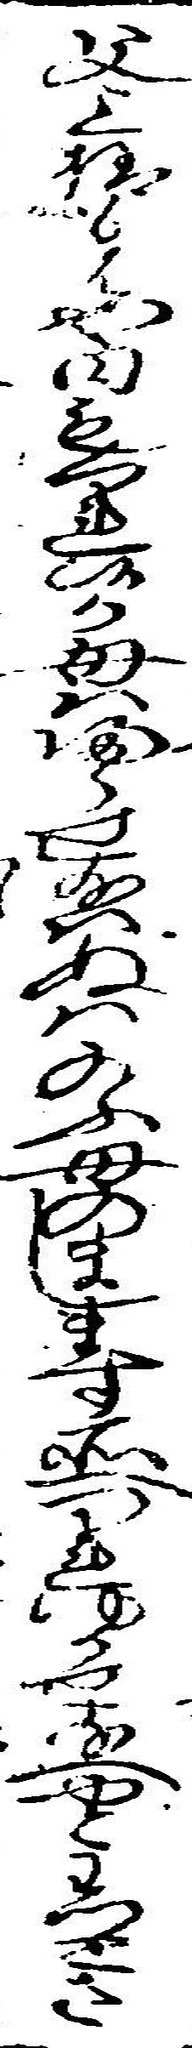父上様もはや日もくれ候かはゝは帰らせ給はぬはのふはゝのまします所へつれゆかせ給へやとわつとさ
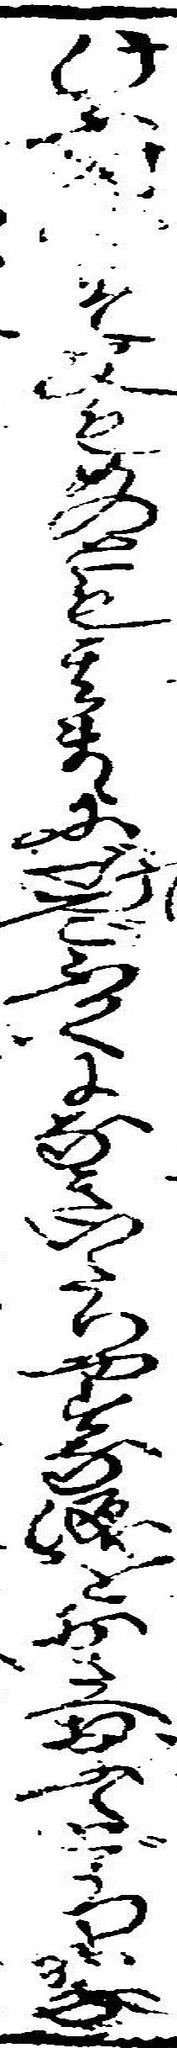けふそ父もめのとも其まゝにふしぜんごふかくになきいたりやすな涙をおさへおふ〳〵どうりかな
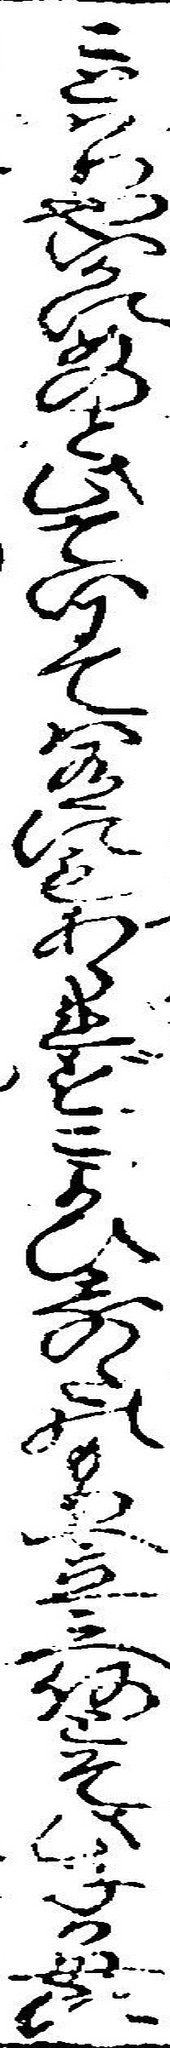ことはりやいかにめのと此ていにては有にもあられずこよひしのたのもりへ立こへ何とそ此子か母に
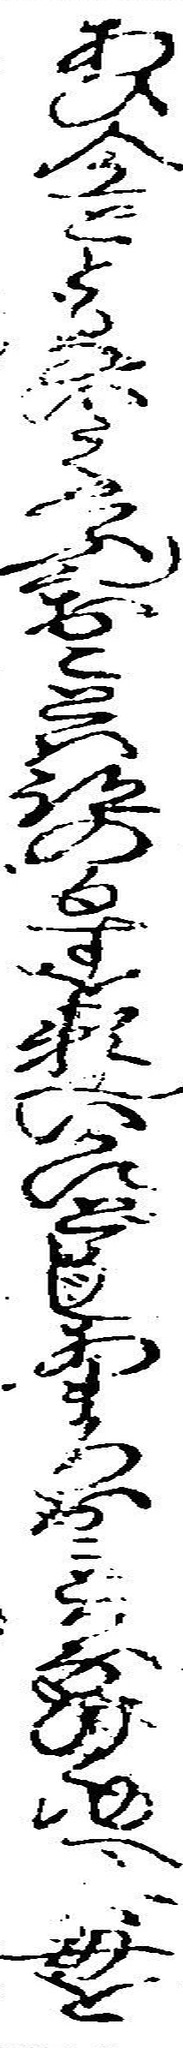あひ今一とともないたく思ふ也おことは跡のるすを頼也いかにどうじあまりおことかなけくゆへ母を
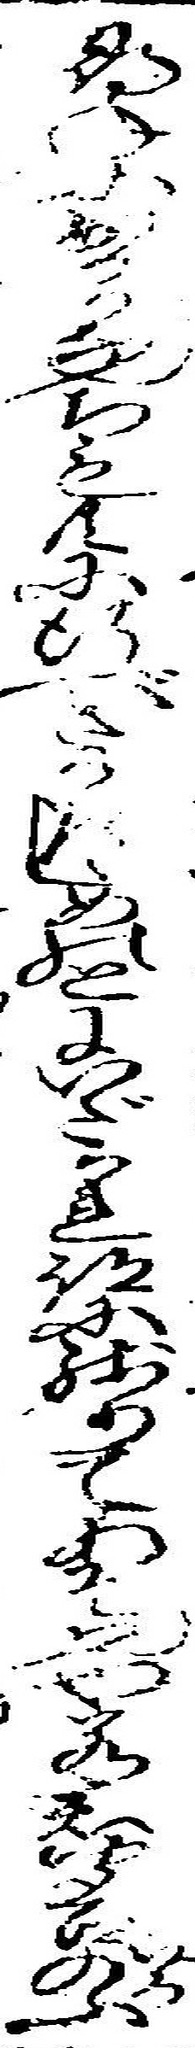尋ねに出るかなんちも共に行べきかたゝしめのとにいだかれ跡に残りてあそはんや若君聞召いろのふ
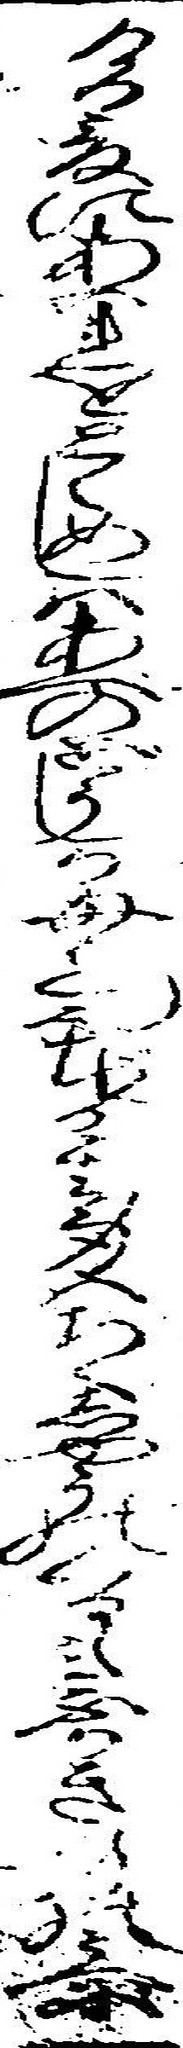ける爰にあはれをとゝめしはあべのとうしか母上也本ゟ其身はちくしやうのくるしみふかきの上に
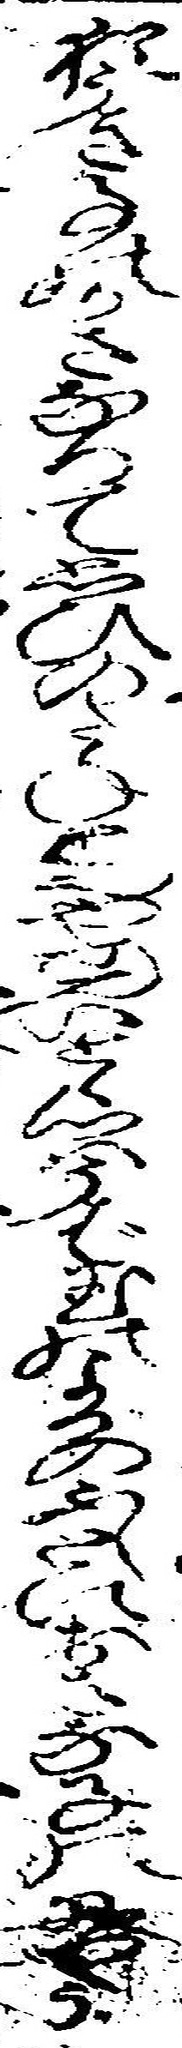猶うき事のかさなりて思ひのたねと也やせんいとゝ心はうば玉のよるのふしとにおさな子のや

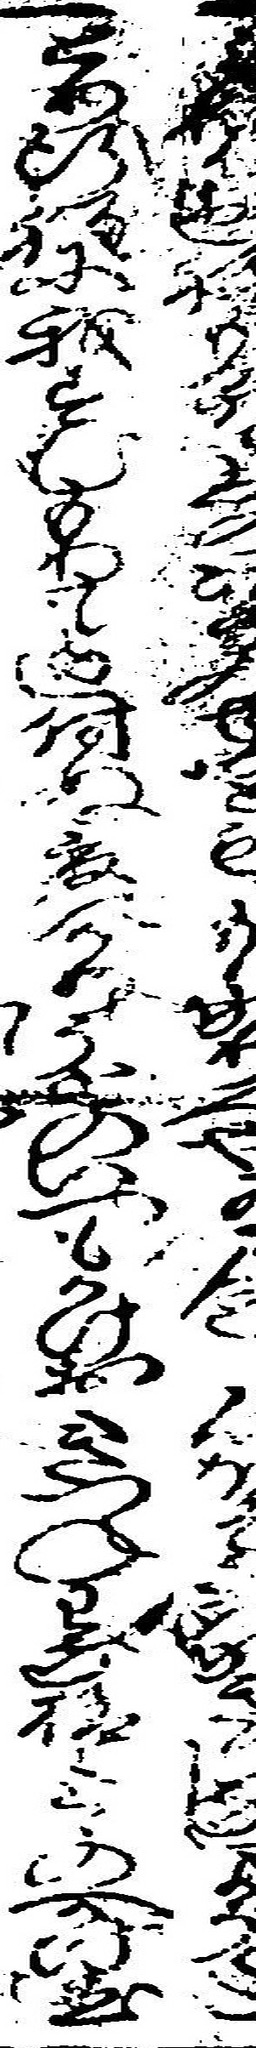とり行程に我すむもりも近付ぬ爰にかりうとのいつもかけおくきつねわな様のへかけ置
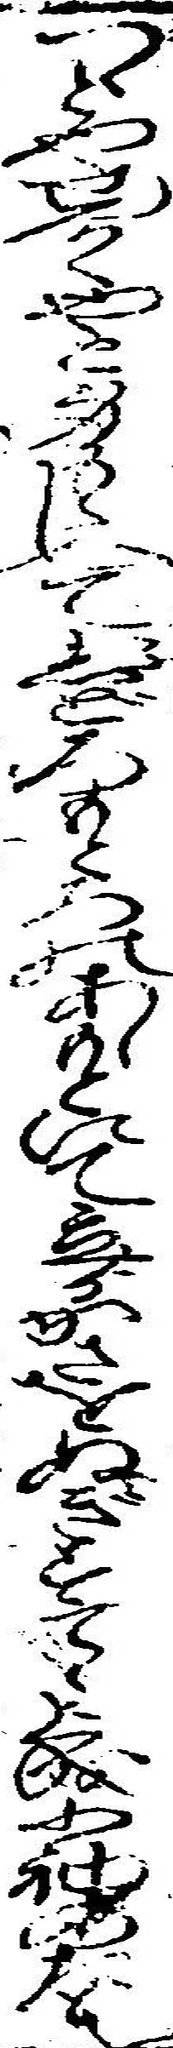つゝとやせんかくやと身もたへしてふししどろもとろのあしもとにて立ゟかさをぬぎすてゝ上成小袖のたも
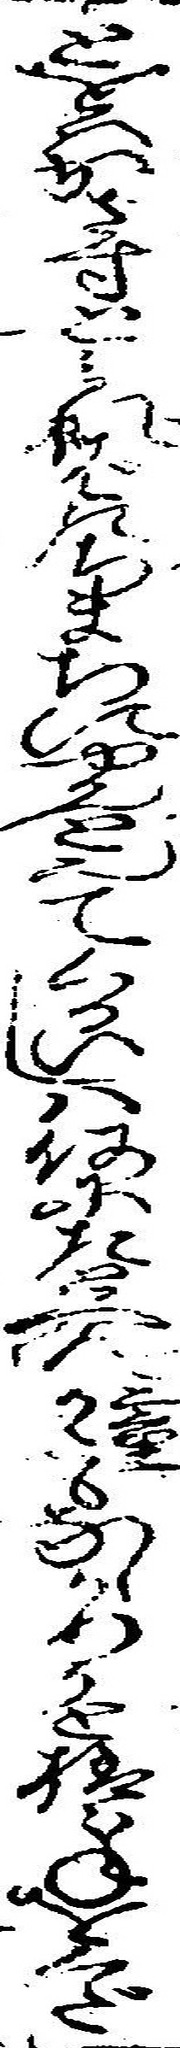とをかさすとみればたちまちにやかんと也てくるいしは何にたとへん三重かたもなしかりうと様々手をくだ
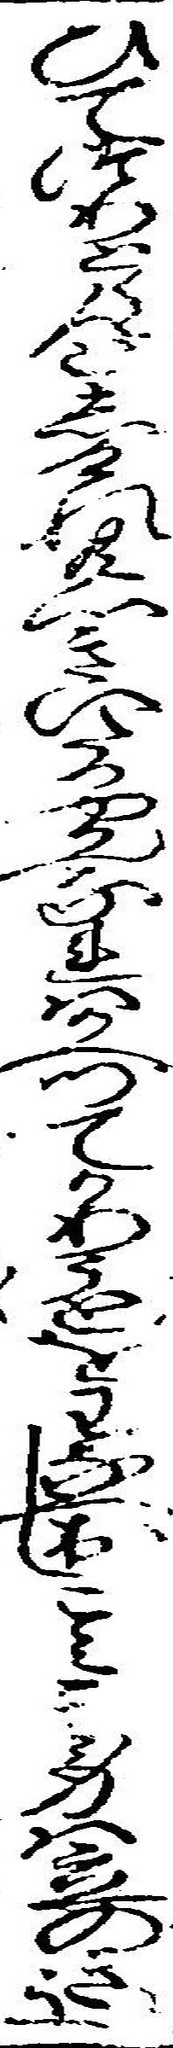ひてつりとらんとしけれ共心きいたるやかんなれはかへつてかりうとをわなへおしこみ其身は立のきう
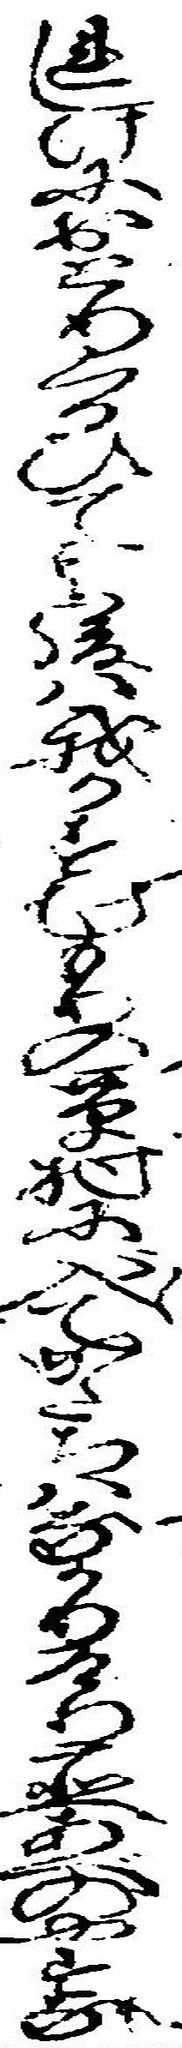れしけにおとりくるひて其後は我かすむもりの草村にふし入てかたちはなかりけり所へあべのやすな
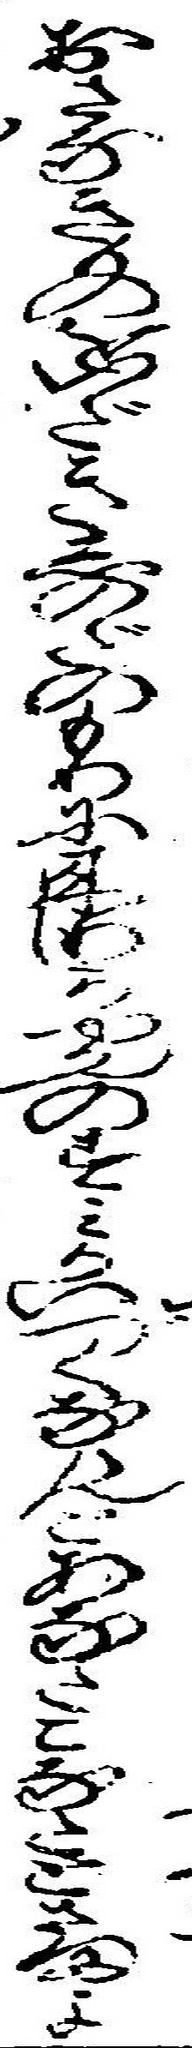おさなきものをいだきしのだのもりに来りしかやかんのすみかいつくならんとあなたこなたとさまよ
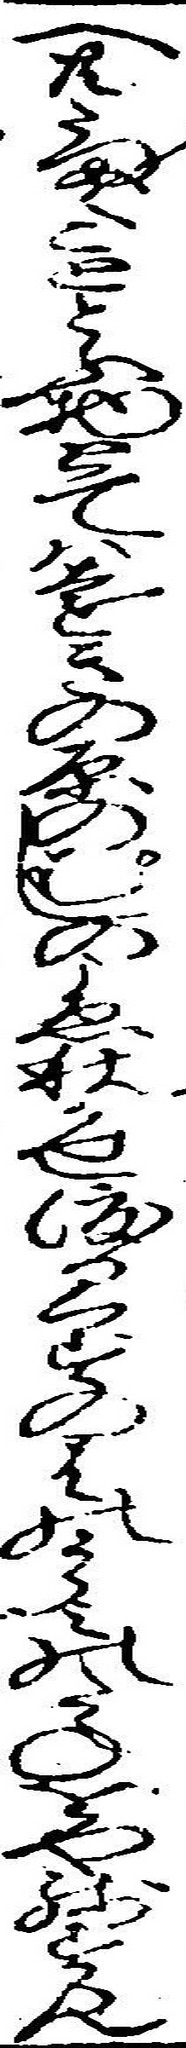へ共たま〳〵こととふ物とてはとをきの原のむしのこゑ秋かせ渡るくすのはのうらみのたねをや残すらん
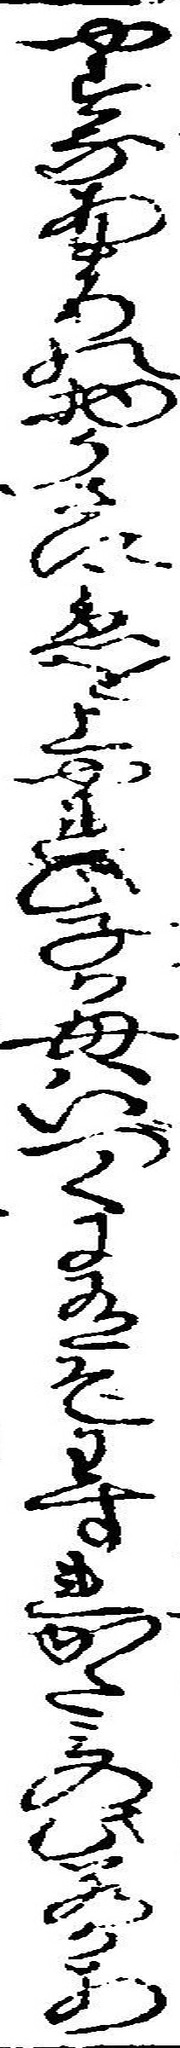やすなあまりの物うさにこゑを上やれ此子か母はいづくに有ぞわすれがたみの此若かあ
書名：[しのだづまつりぎつね付あべの清明出生]
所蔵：東京大学総合図書館 General Library in the University of Tokyo, JAPAN
